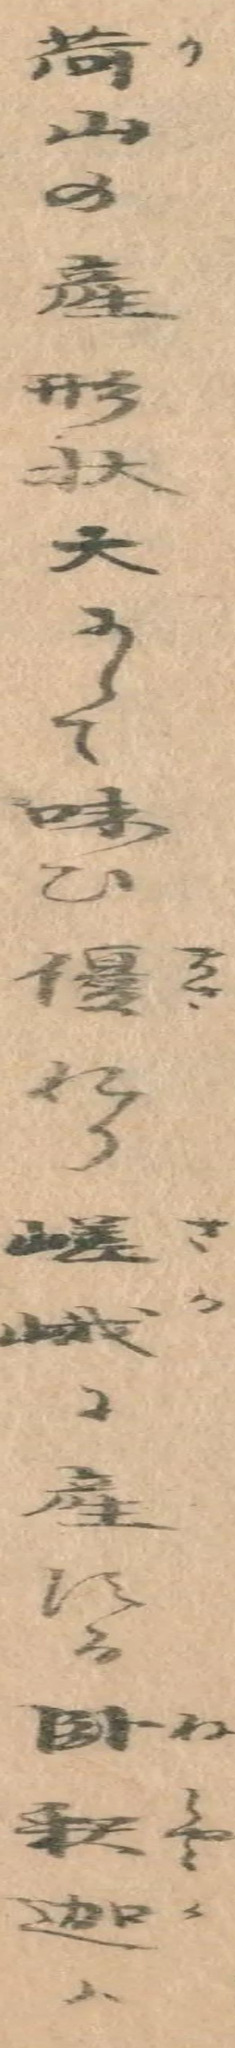荷山の産形状大にして味ひ優れり嵯峨に産する臥釈迦は
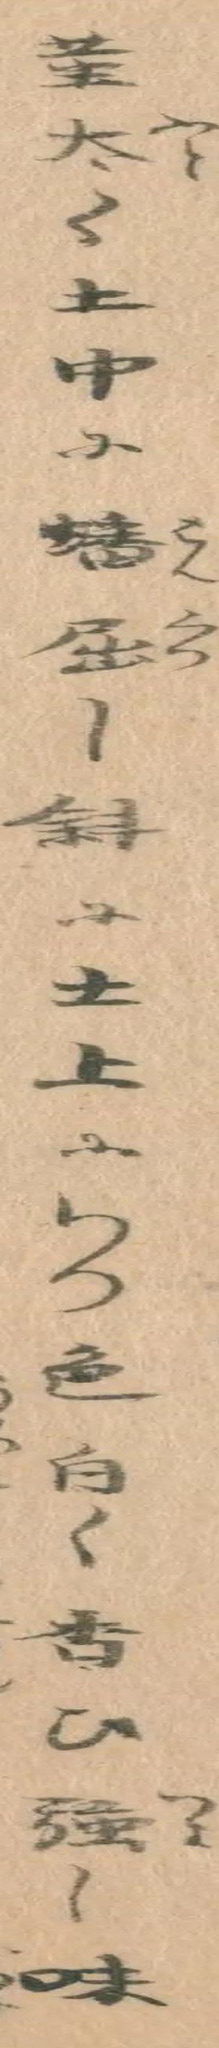茎太く土中に蟠屈し斜に土上にいつ色白く香ひ強し味
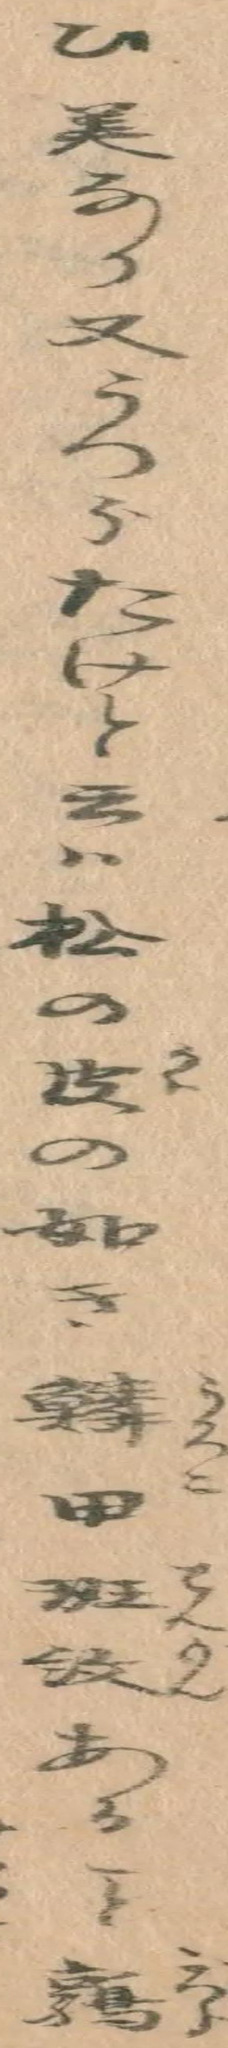ひ美なり又うつらたけと云は松の皮の如き鱗甲斑紋あること鶉
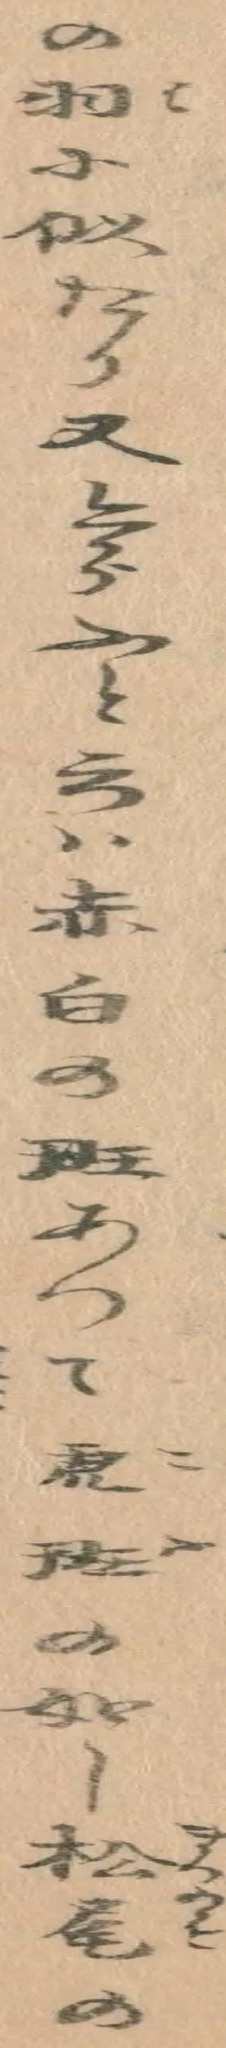の羽に似たり又とらふと云は赤白の斑あつて虎斑の如し松尾の
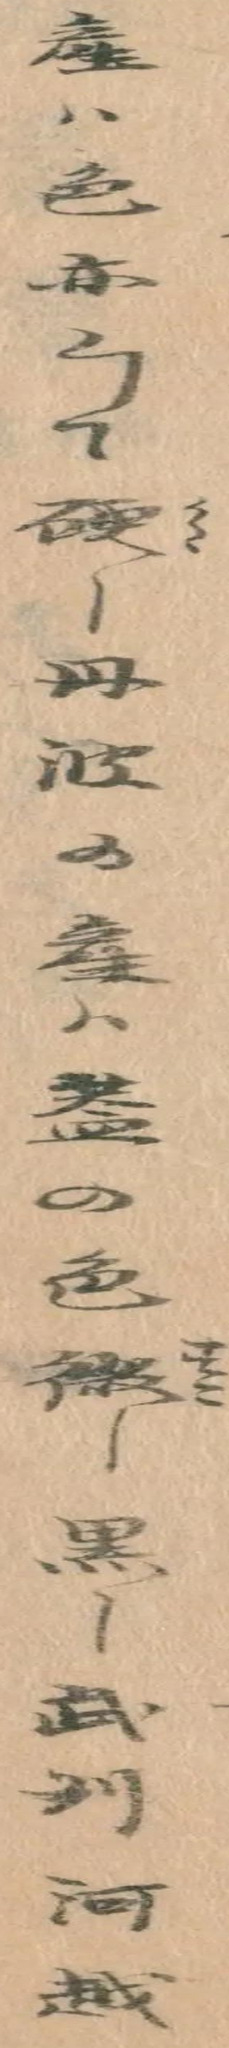産は色亦くして硬し丹波の産は蓋の色微し黒し武州河越
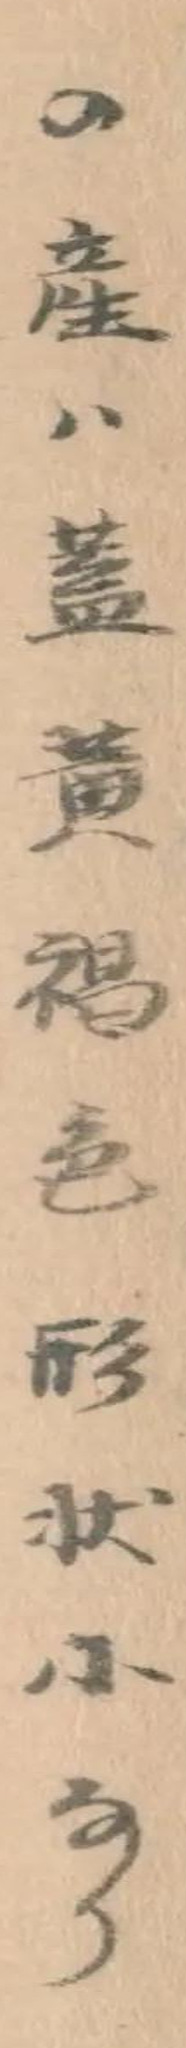の産は蓋黄褐色形状小なり
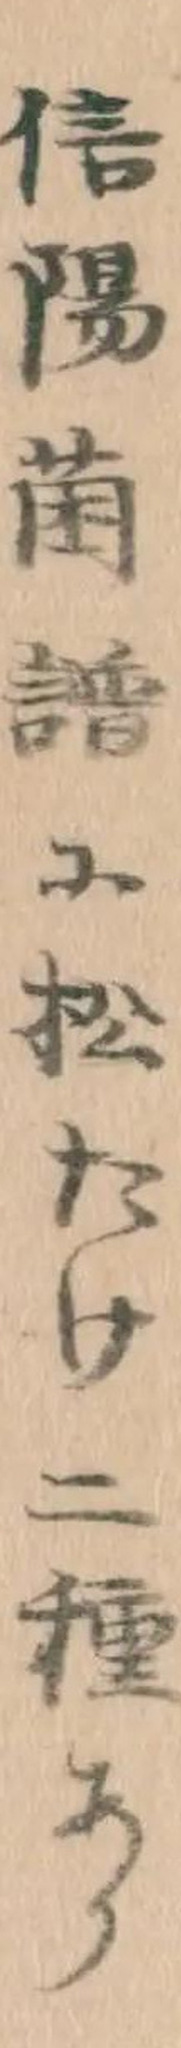信陽菌譜に松たけ二種あり
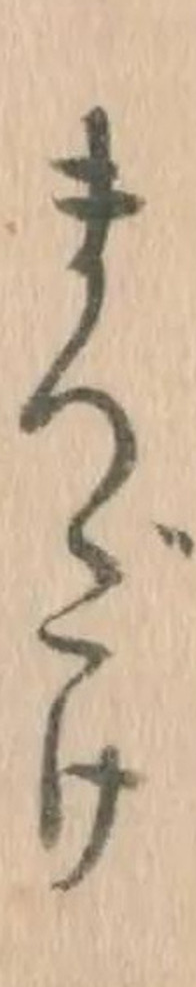まつだけ
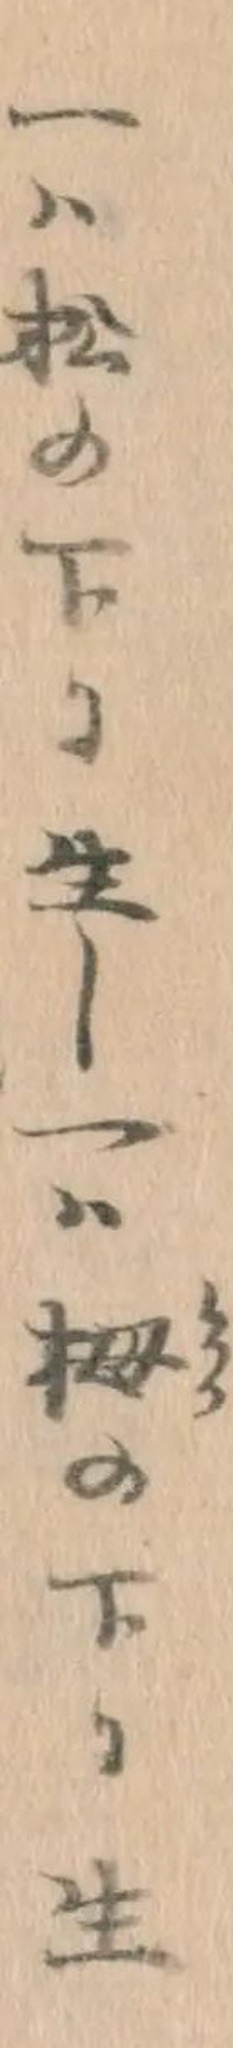一は松の下に生し一は栂の下に生
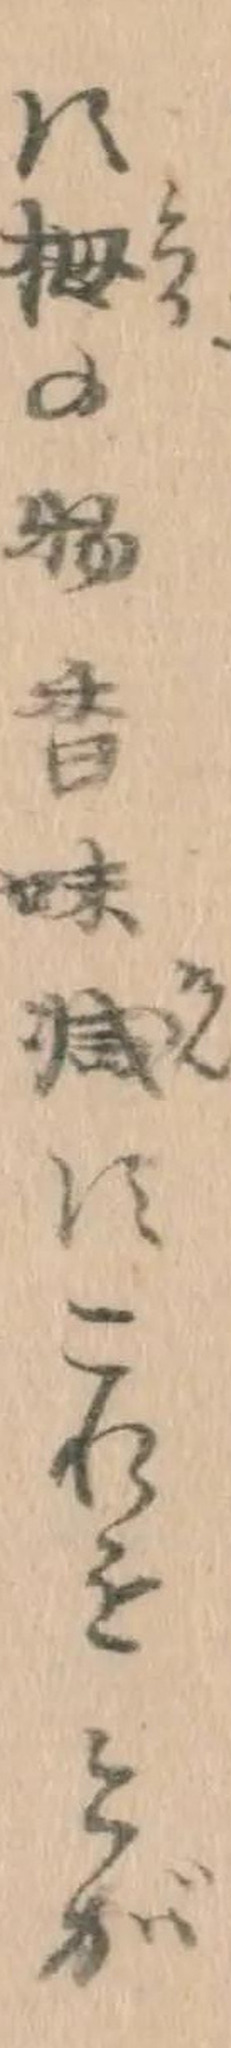す栂の物香味減すこれをとが
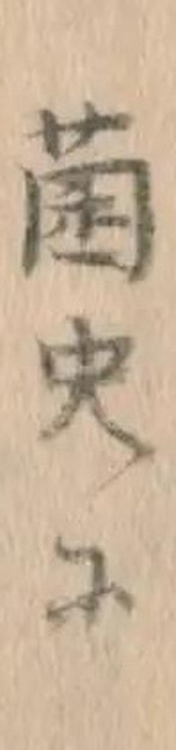菌史に
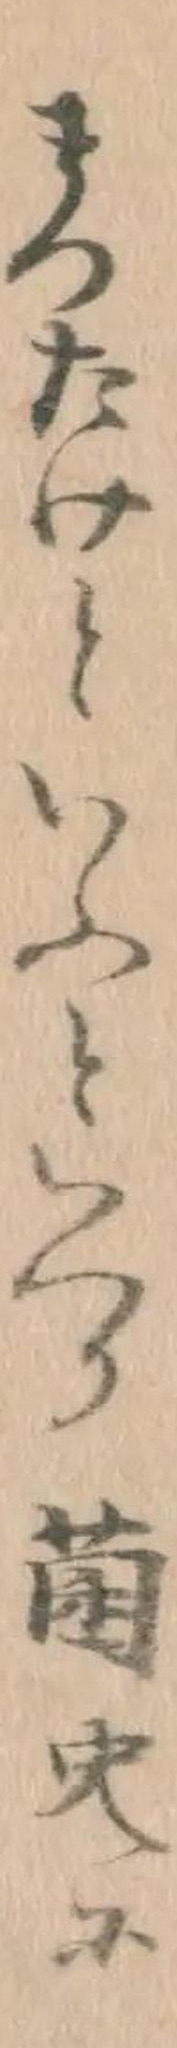まつたけといふといへり菌史に
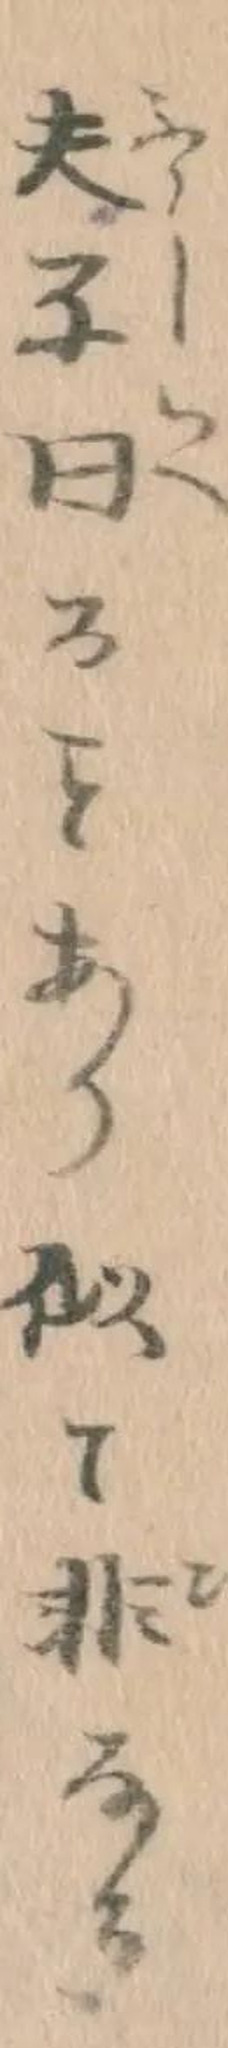夫子曰ることあり似て非なる
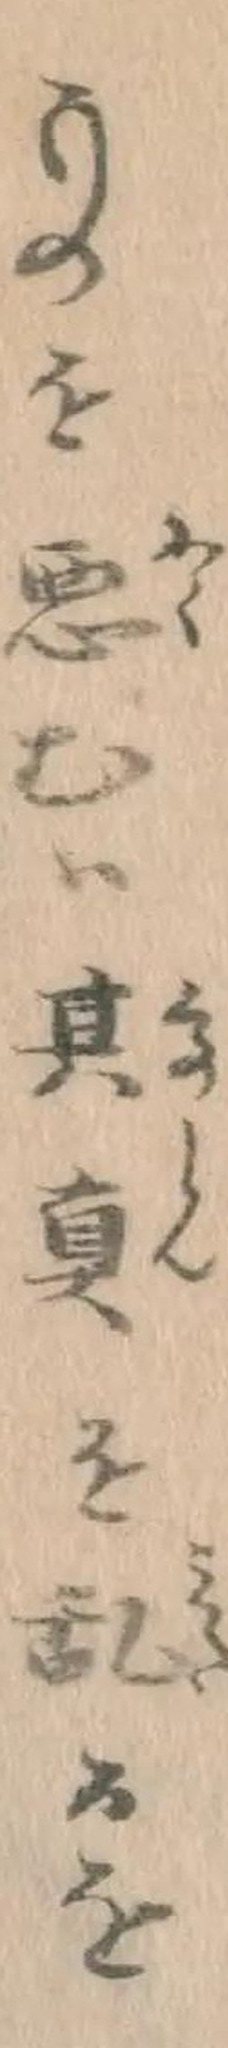ものを𢙣むは其真を乱るを
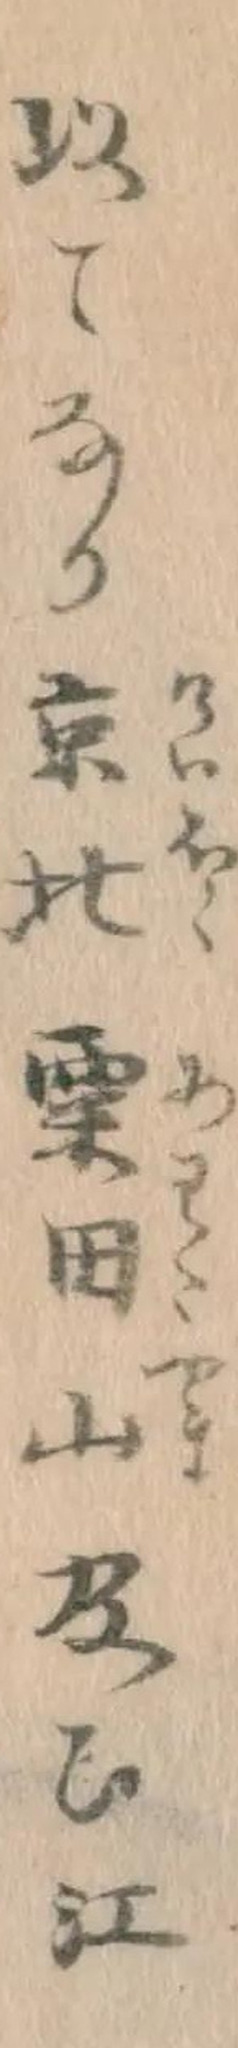以てなり京北粟田山及ひ江
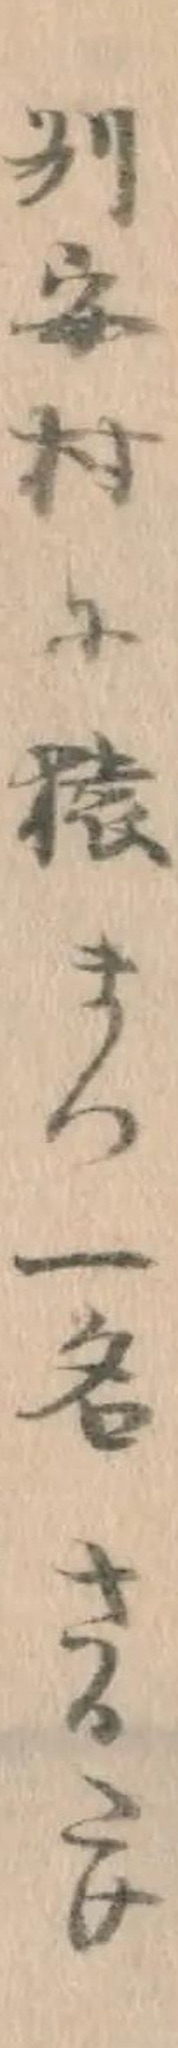州安村に猿まつ一名さるたけ
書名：本草図譜. 巻55-57
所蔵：国立国会図書館 National Diet Library, JAPAN
